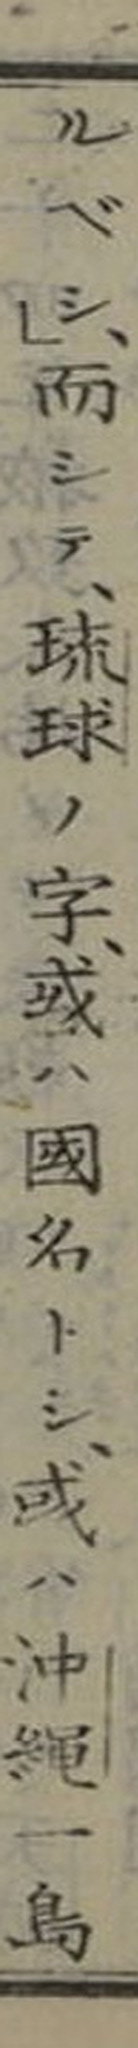ルベシ、」而シテ、琉球ノ字、或ハ国名トシ、或ハ沖縄一島
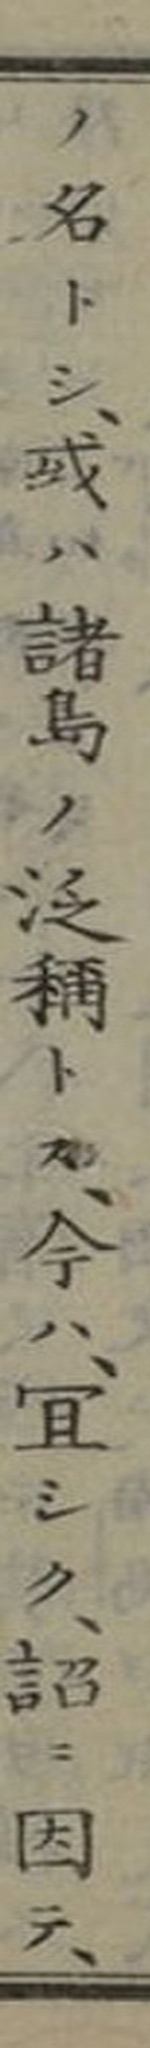ノ名トシ、或ハ諸島ノ泛称トス、今ハ、宜シク、詔ニ因テ、
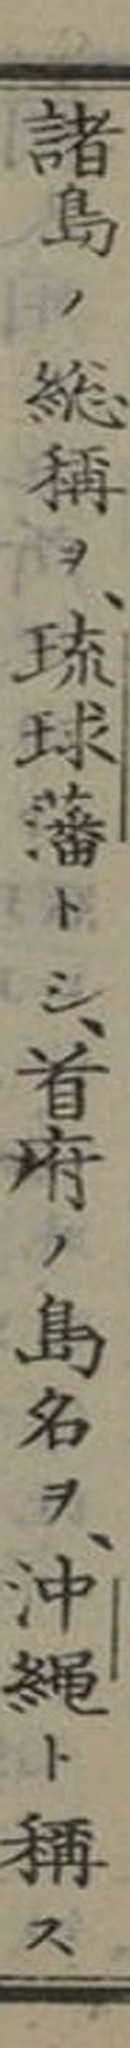諸島ノ総称ヲ、琉球藩トシ、首府ノ島名ヲ、沖縄ト称ス
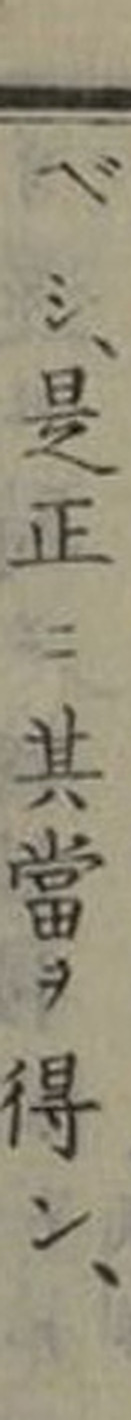ベシ、是正ニ其当ヲ得ン、
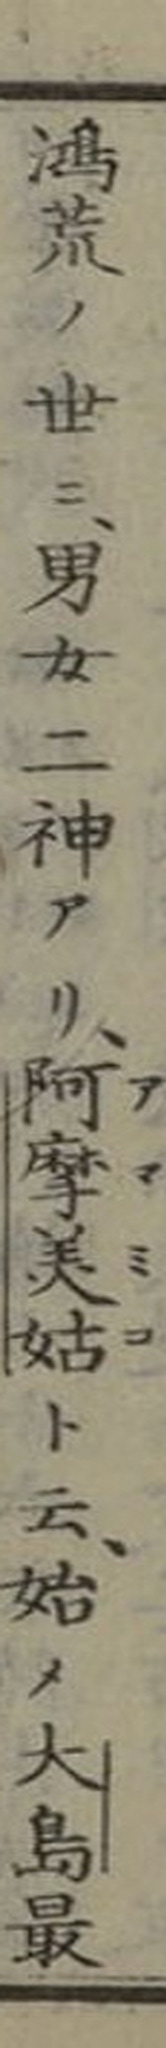鴻荒ノ世ニ、男女二神アリ、阿摩美姑ト云、始メ大島最
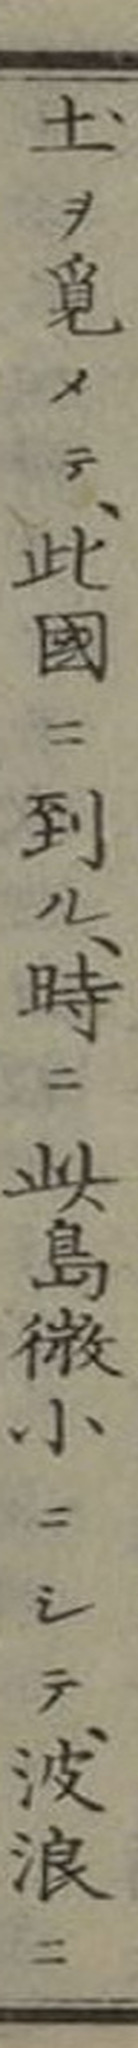土ヲ覓メテ、此国ニ到ル、時ニ此島微小ニシテ、波浪ニ
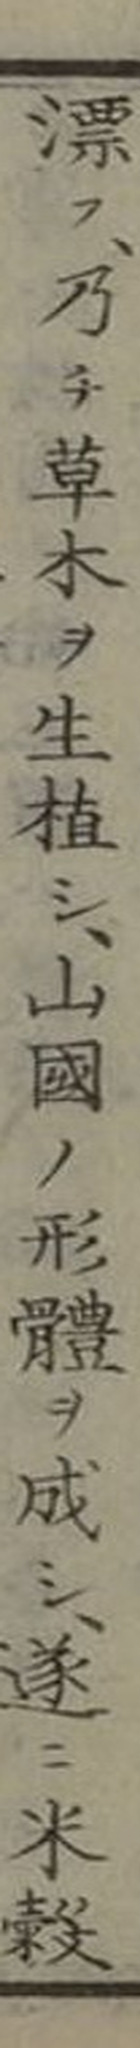漂フ、乃チ草木ヲ生植シ、山国ノ形体ヲ成シ、遂ニ米穀

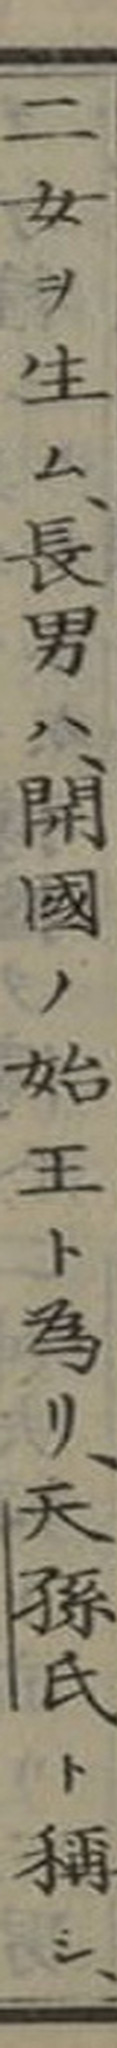二女ヲ生ム、長男ハ、開国ノ始王ト為リ、天孫氏ト称シ、
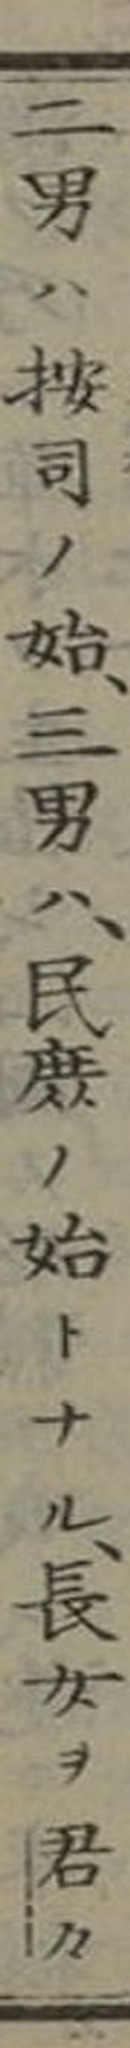二男ハ按司ノ始、三男ハ、民庶ノ始トナル、長女ヲ君々
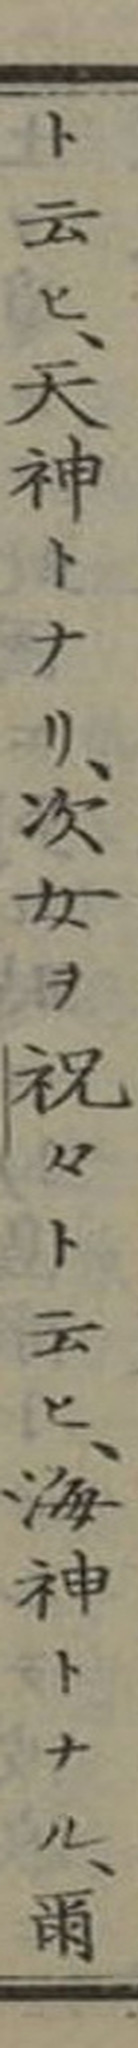ト云ヒ、天神トナリ、次女ヲ祝々ト云ヒ、海神トナル、爾
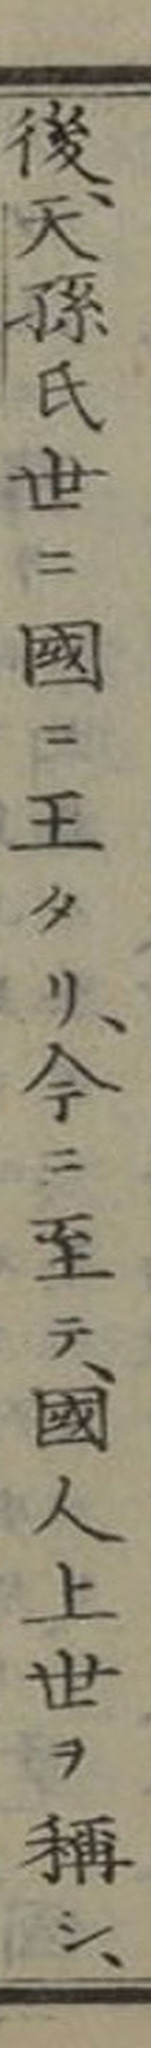後、天孫氏世ニ国ニ王タリ、今ニ至テ、国人上世ヲ称シ、
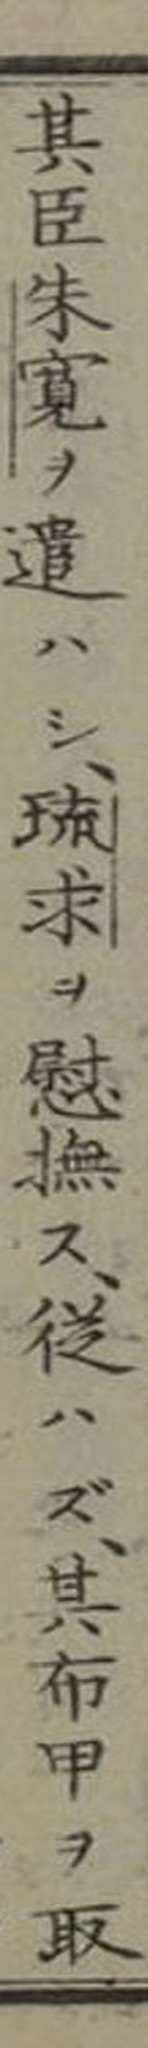其臣朱寛ヲ遣ハシ、琉求ヲ慰撫ス、従ハズ、其布甲ヲ取
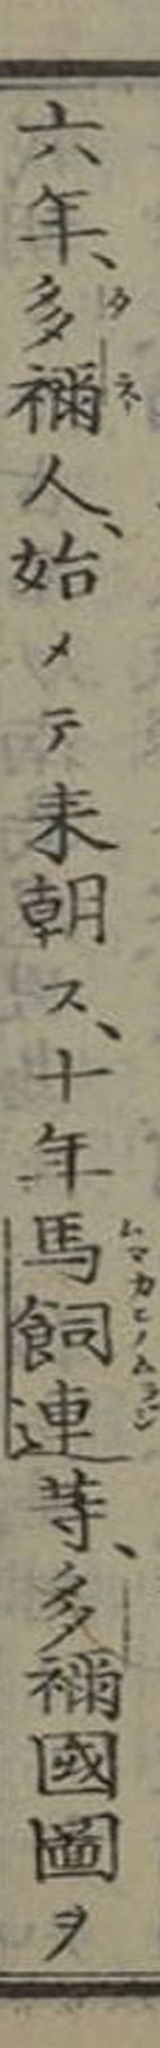六年、多禰人、始メテ来朝ス、十年馬飼連等、多禰国図ヲ
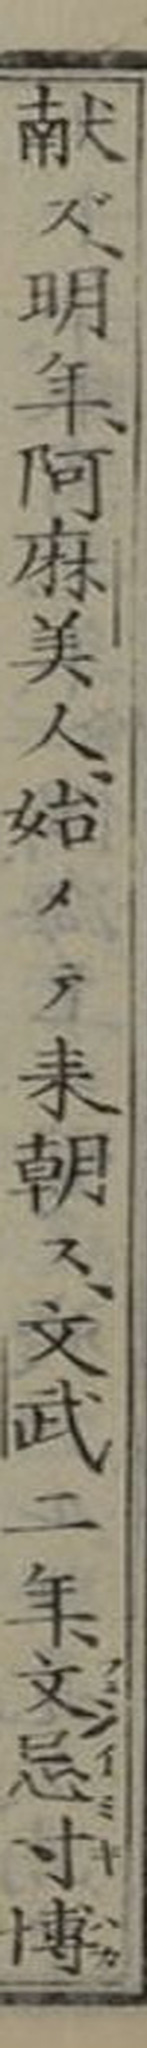献ズ、明年、阿麻美人、始メテ来朝ス、文武二年、文忌寸博
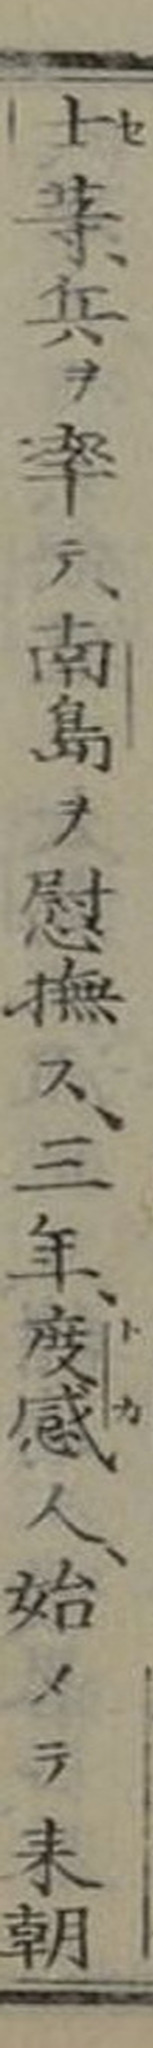士等、兵ヲ率テ、南島ヲ慰撫ス、三年、度感人、始メテ来朝
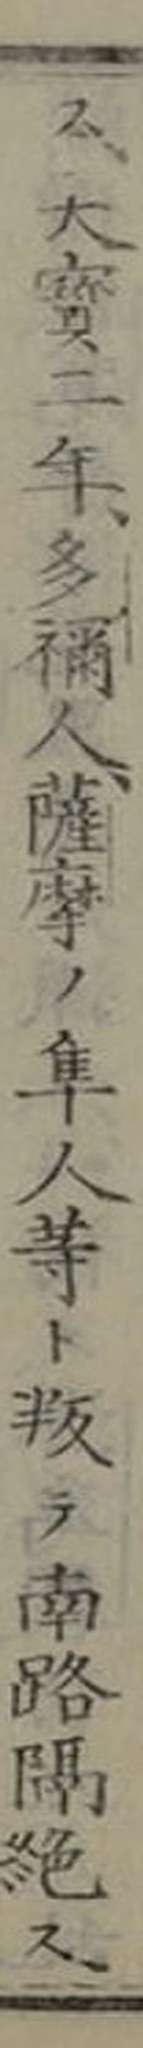ス、大宝二年、多禰人、薩摩ノ隼人等ト叛テ南路隔絶ス、
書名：琉球新誌 図附 上
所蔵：University of the Ryukyus Library
